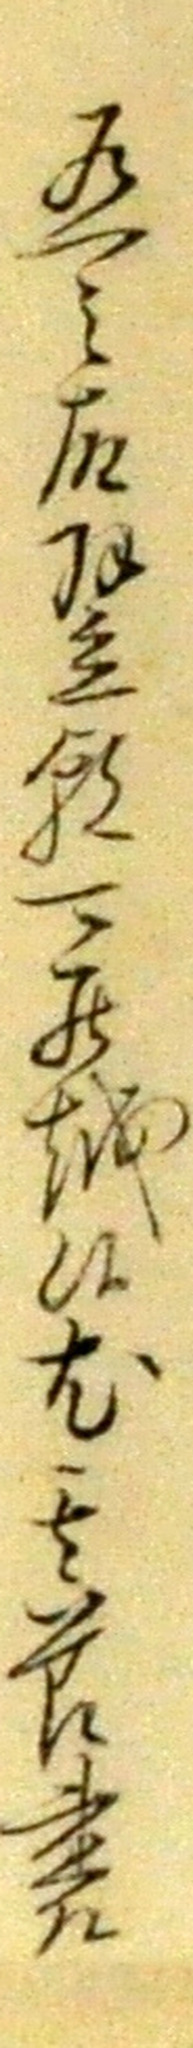有之故翌朝可罷越候尤其節裏
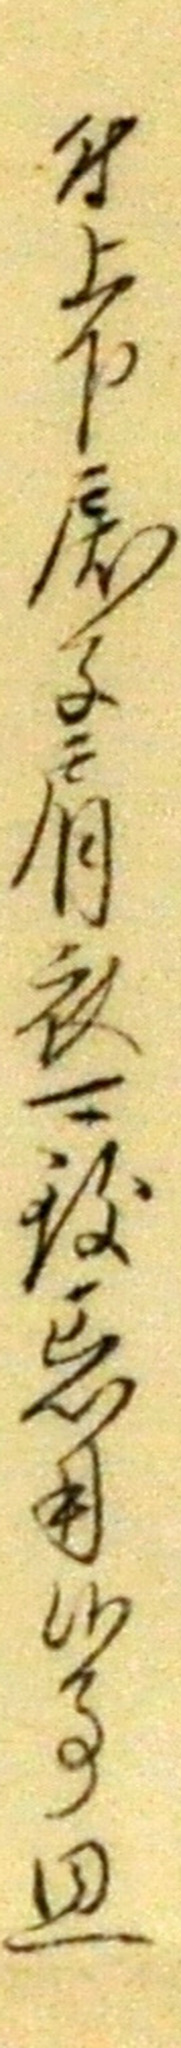付上下戻子肩衣可致着用候事且
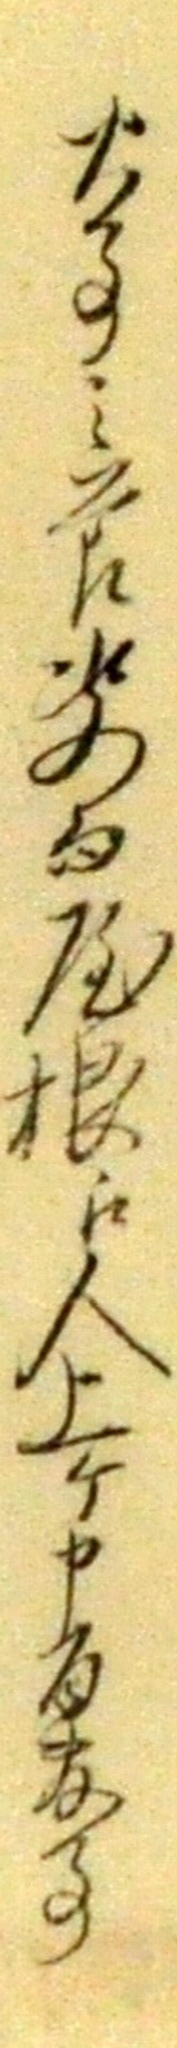火事之節決而屋根え人上ケ申間敷事
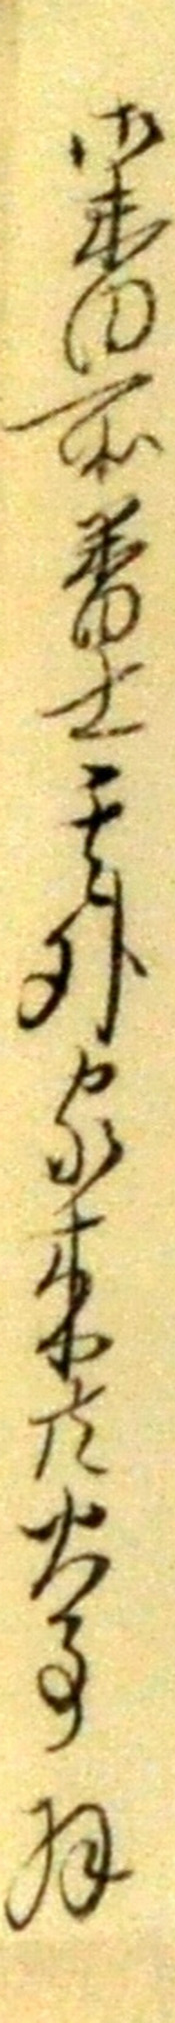御番所番士其外家来共火事羽

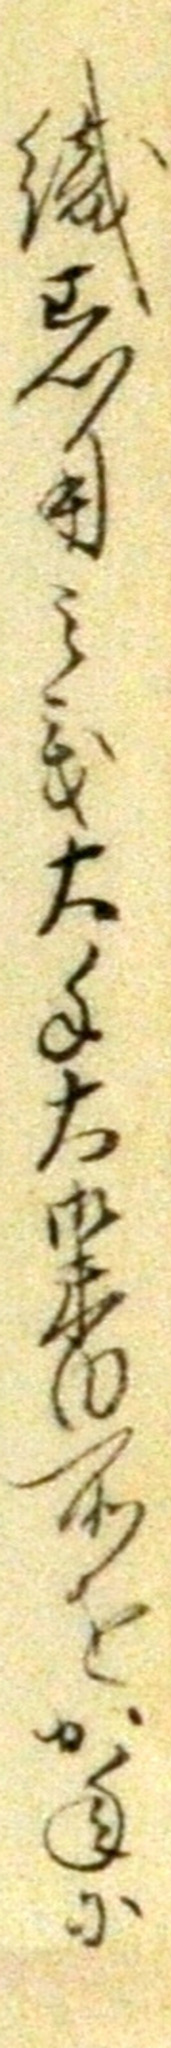織着用之義大手大御番所をかねに
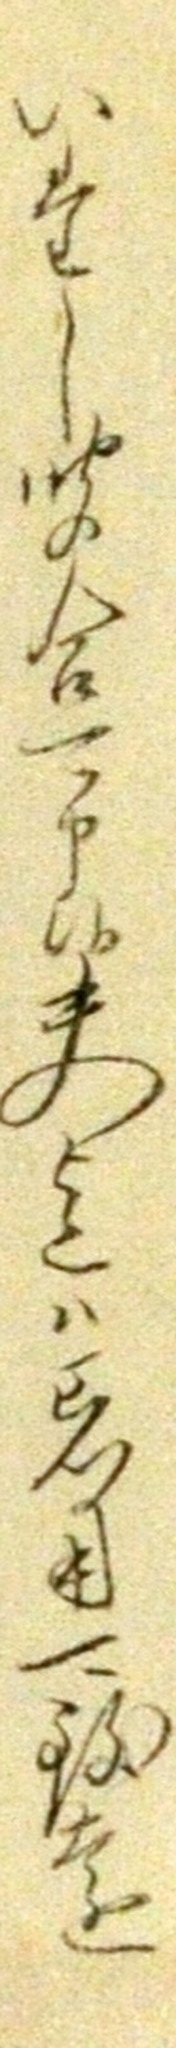いたし聞合可申候夫迄ハ着用可致遠
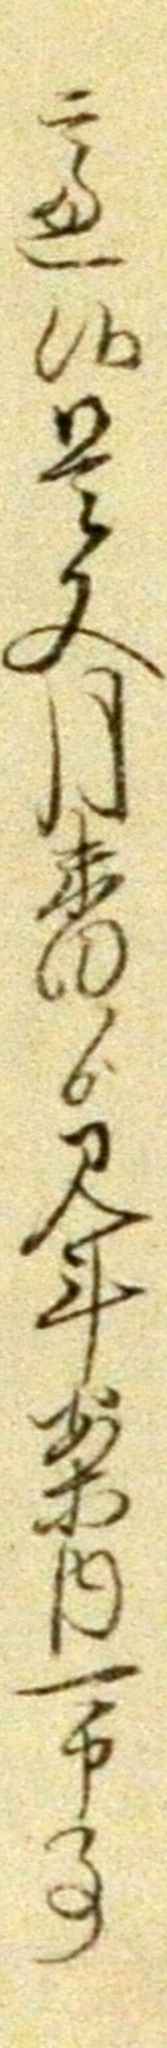慮候是又月番ゟ見計案内可申事
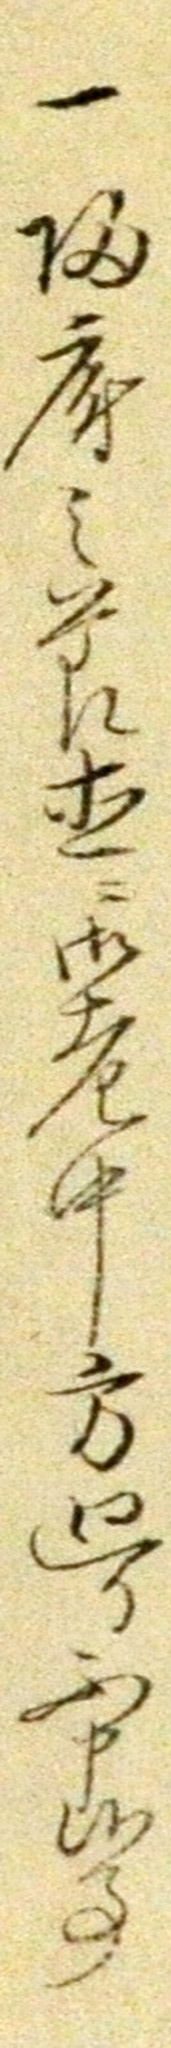一帰府之節直ニ御老中方廻り不申候事
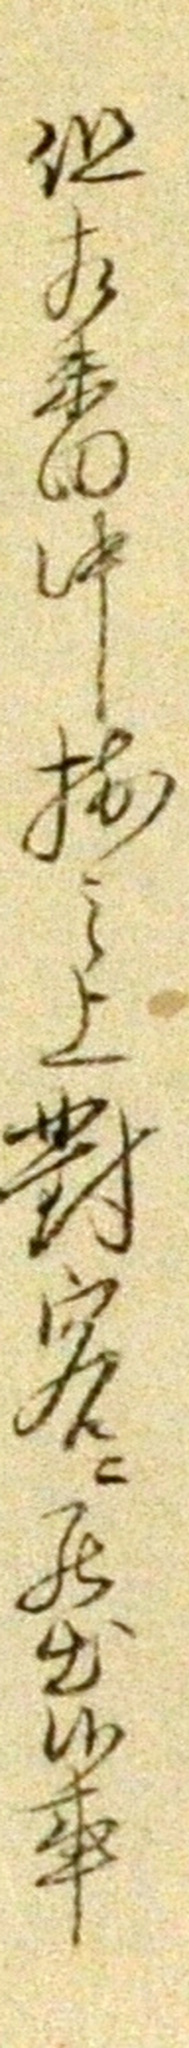但相番中揃之上對客二罷出候事
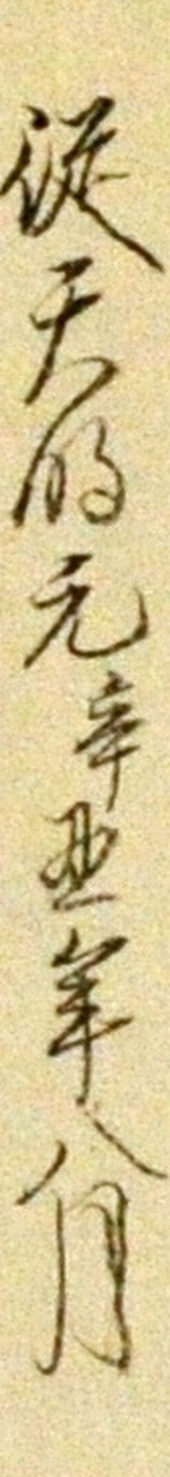従天明元辛丑年八月
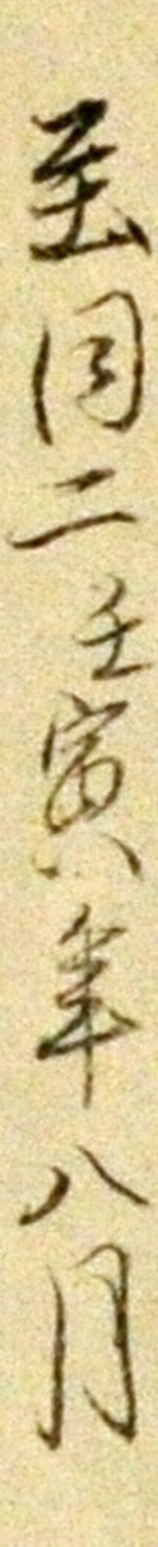至同二壬寅年八月
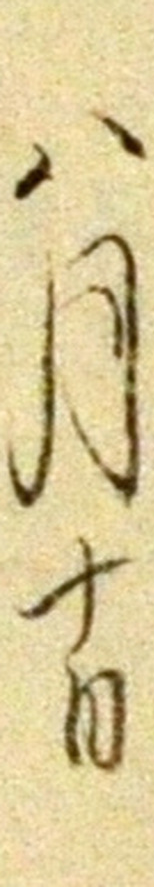八月十日
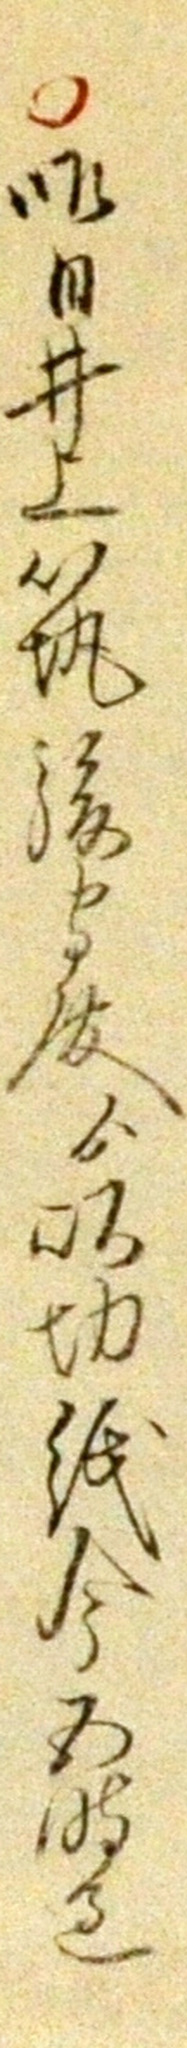昨日井上筑後守殿ゟ以切紙今五時過
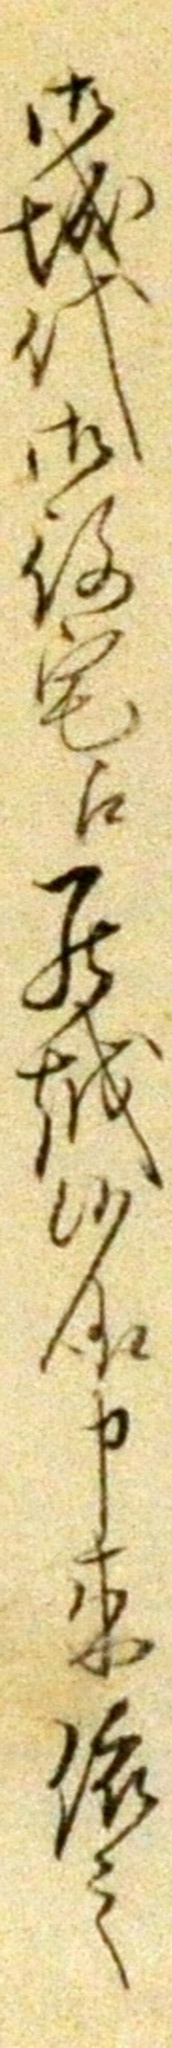御城代御役宅え罷越候様申来依之
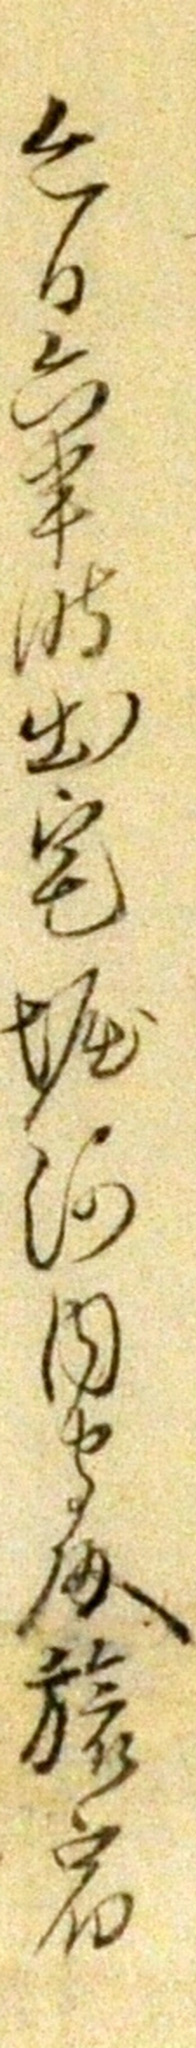今日六半時出宅堀河内守殿旅宿
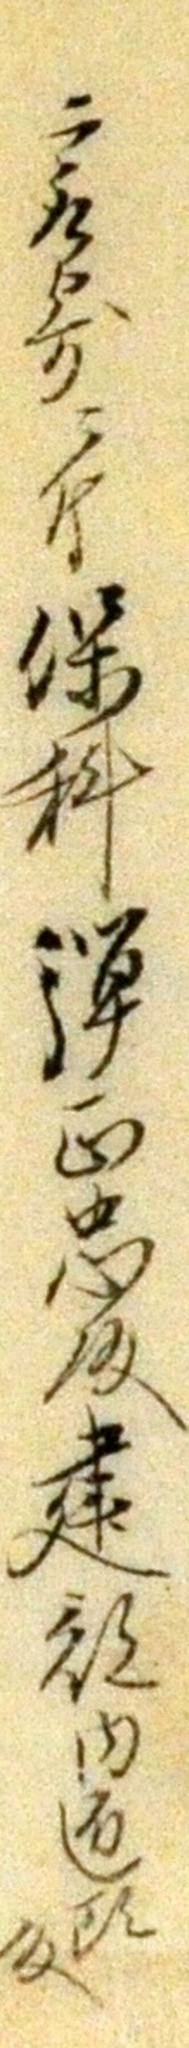最寄ニ付保科弾正忠殿建部内匠頭殿
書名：大阪加番関係諸書留〔一括〕
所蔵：伊那市立高遠町図書館・合同会社AMANE
